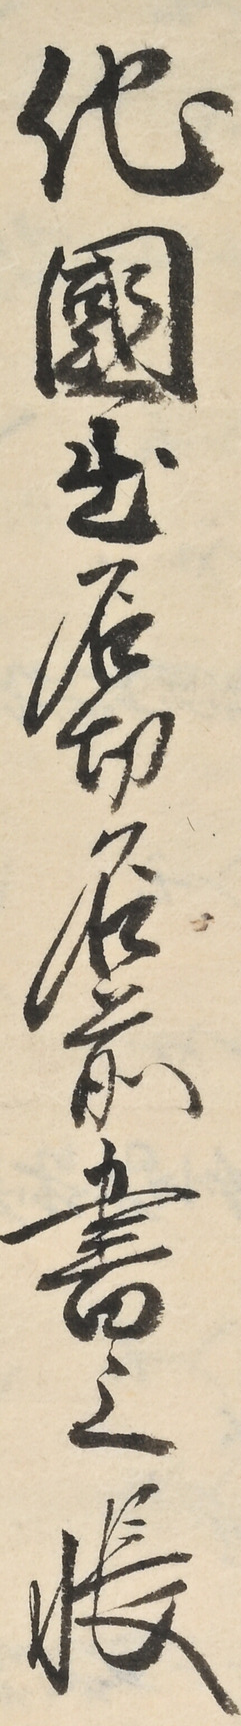他国出石切名前書上帳
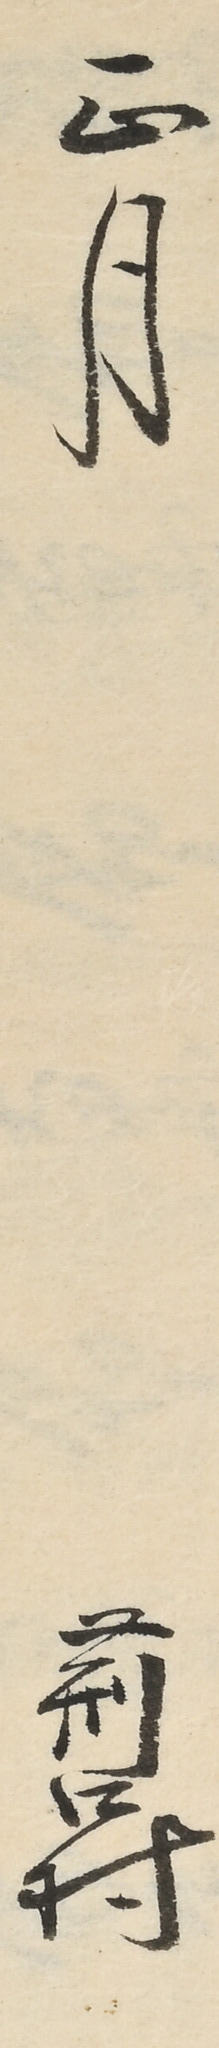正月荊口村

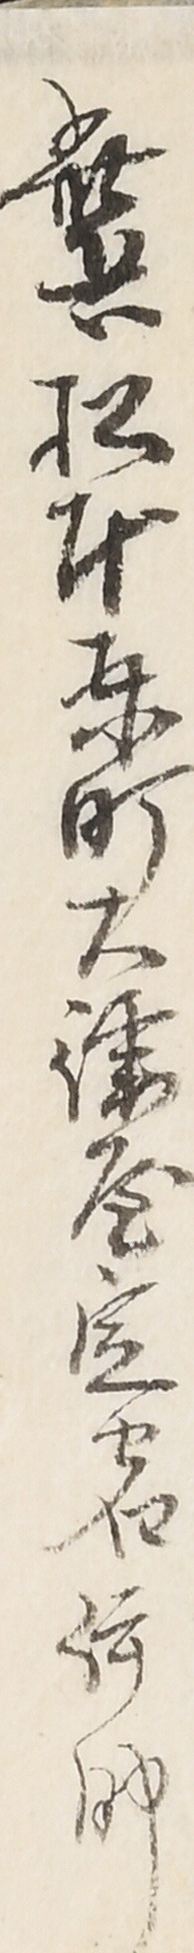此者松本大津屋定宿伊助

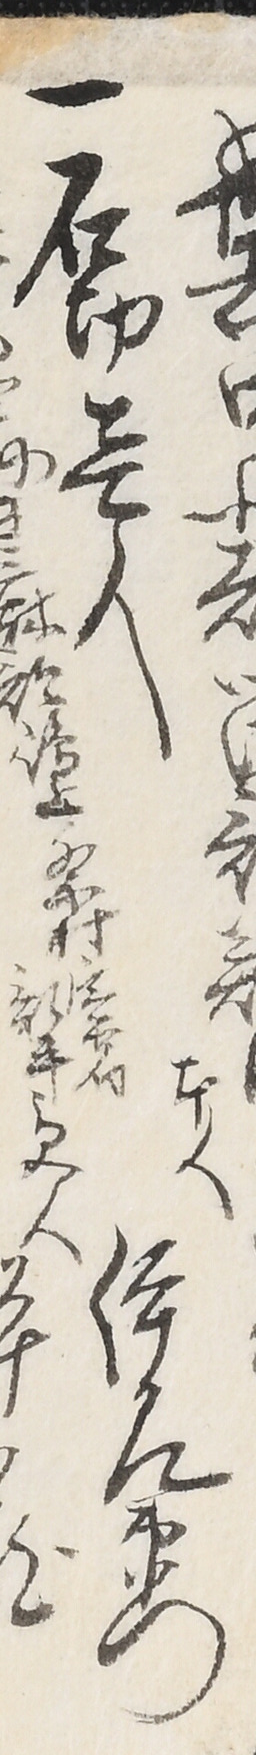一石切壱人本人伊左衛門

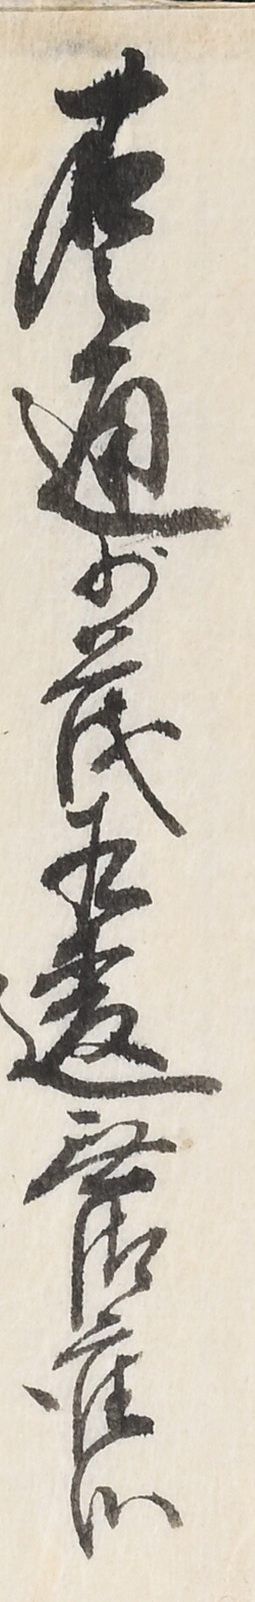右之通少茂相違無御座候
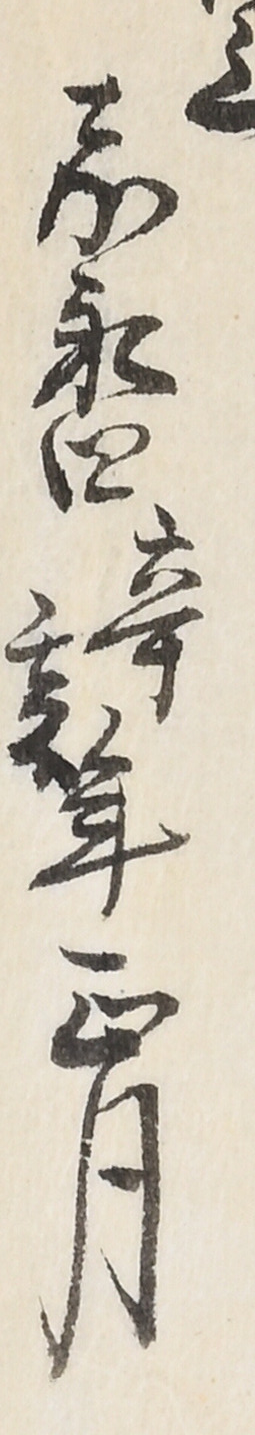嘉永四辛亥年正月
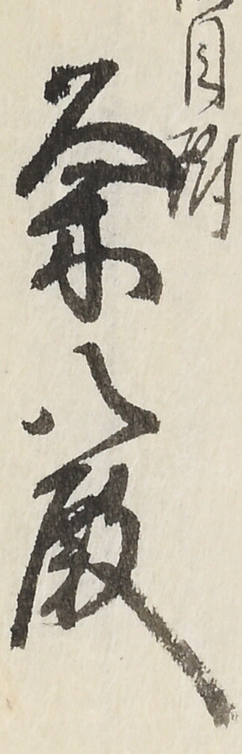粂八殿

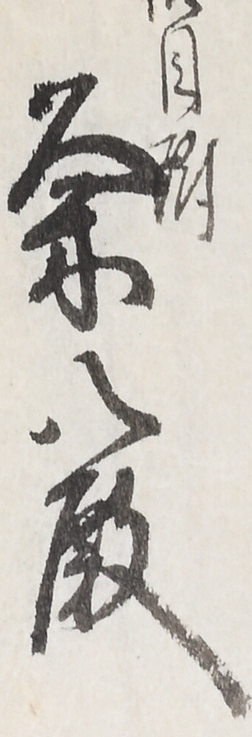粂八殿
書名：嘉永四辛亥年正月他國出石切名前書上帳
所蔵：伊那市立高遠町図書館・合同会社AMANE
